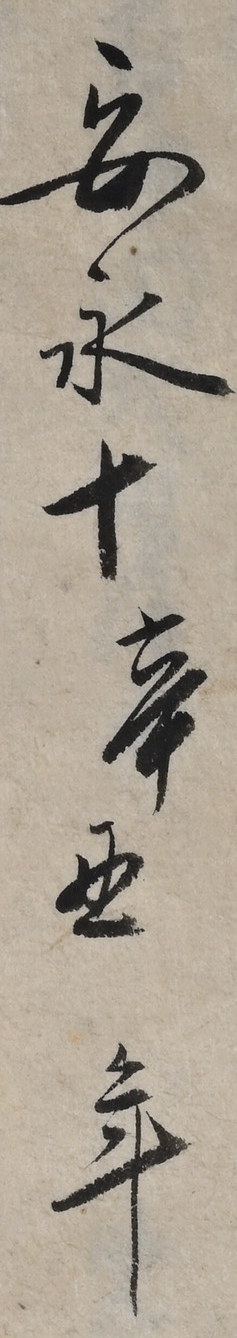安永十辛丑年
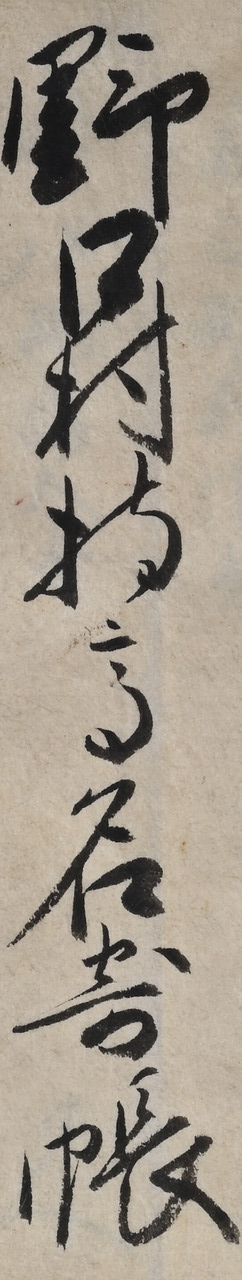野口村持高名寄帳
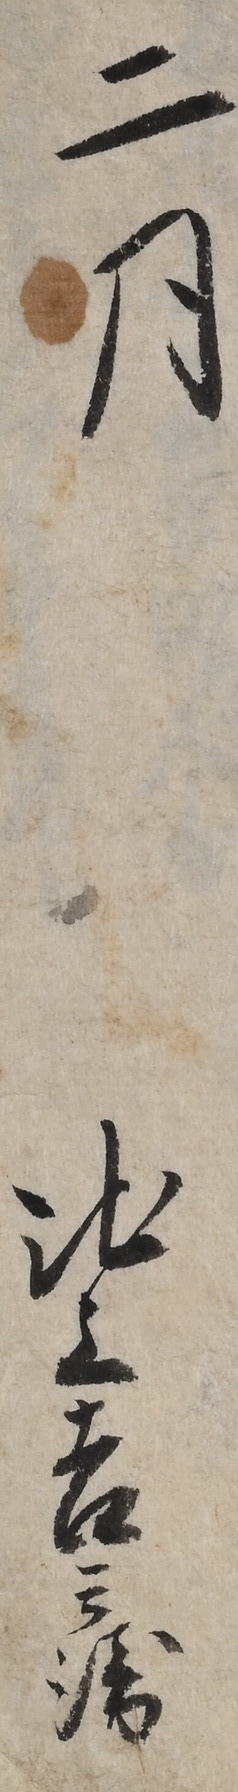二月池上吉兵衛

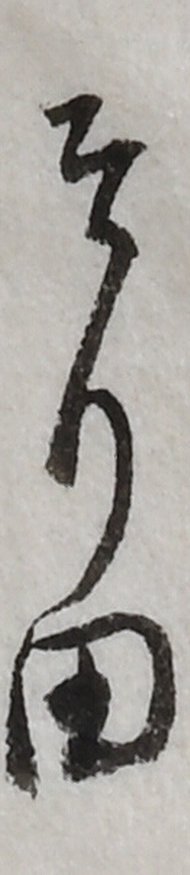そり田
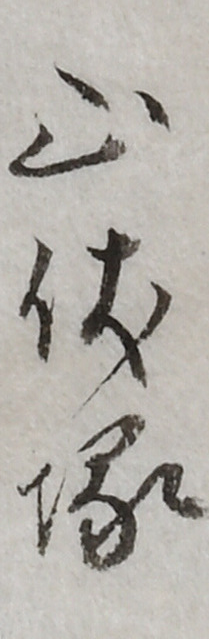山伏家
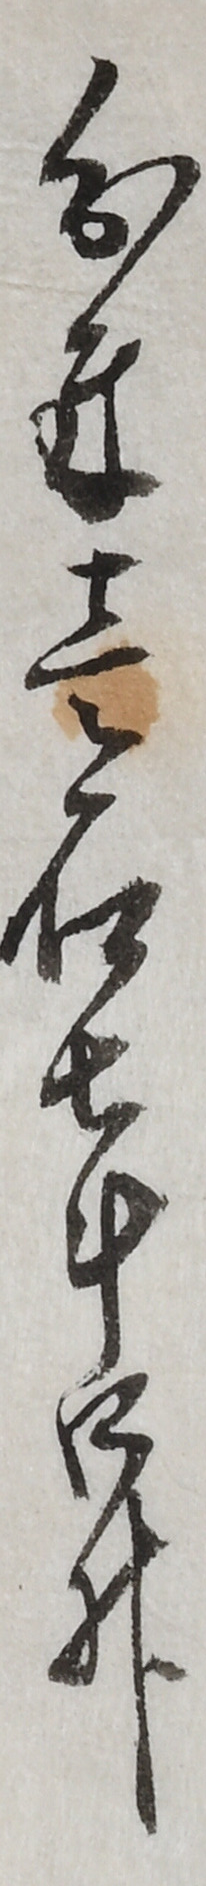分米壱石七斗四升
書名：野口村持高名寄帳
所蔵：伊那市立高遠町図書館・合同会社AMANE
